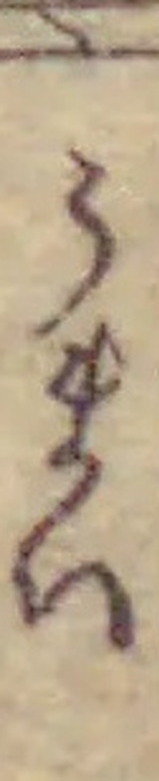うまい
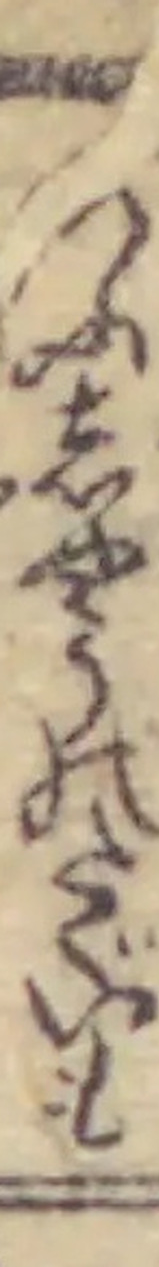ろふしやうのたぐいも
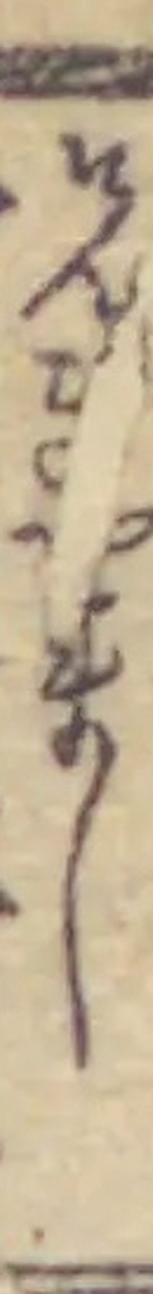けんきをまし
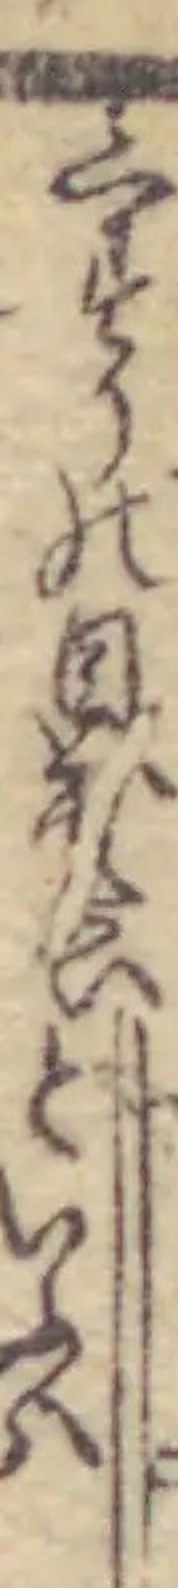くすりの目出たいといふは
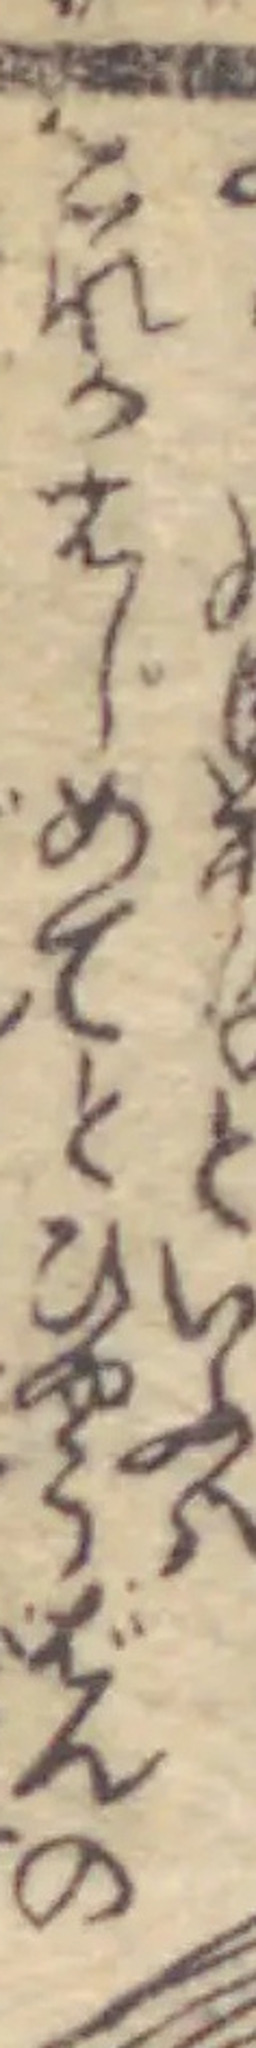これかはじめてとひやうばんの
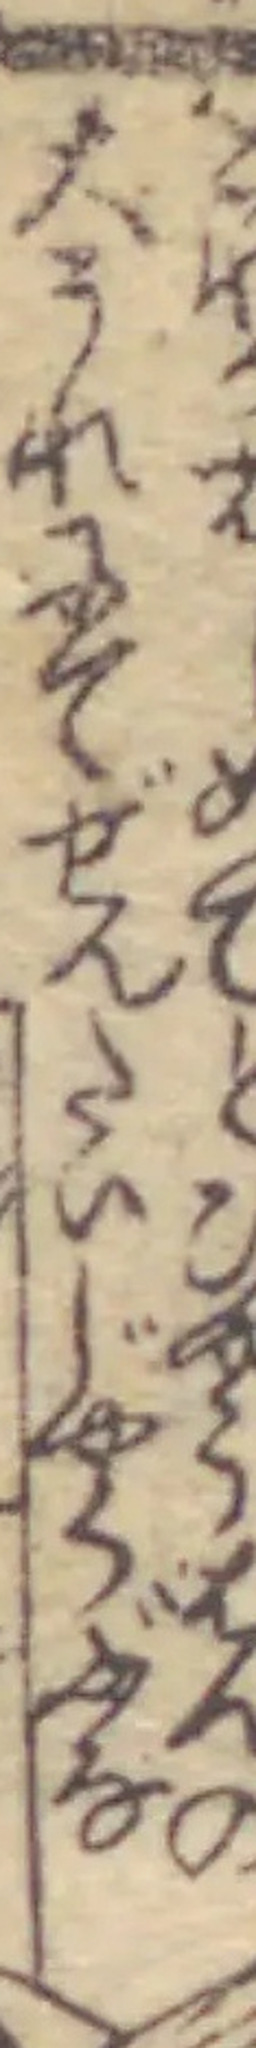大うれにてぜんたいじやうぶな
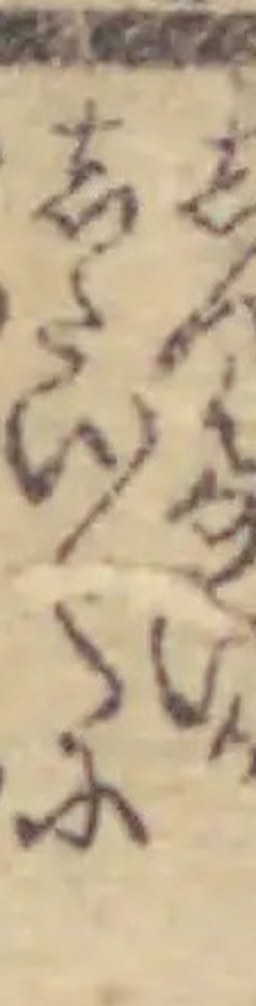したい〳〵に
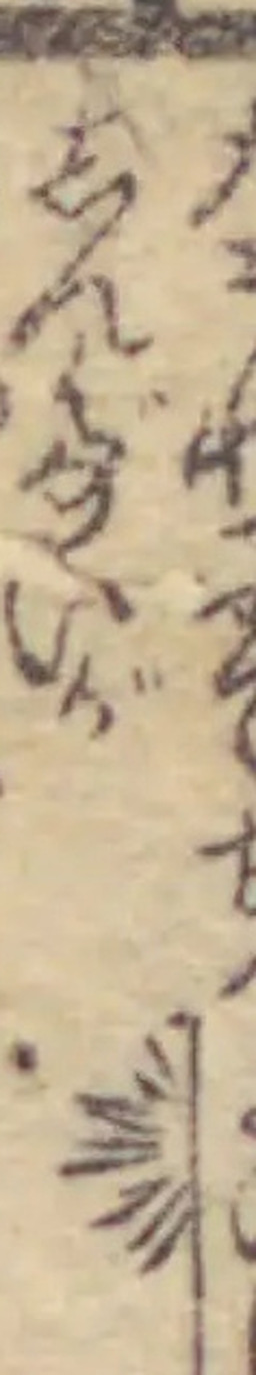しんだいが
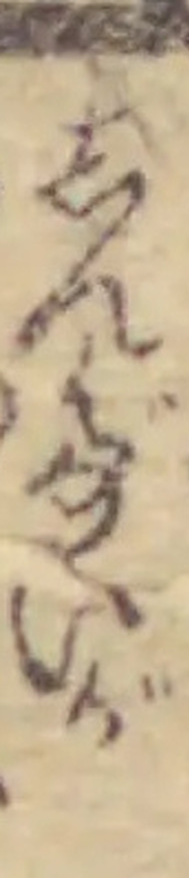しんだいが
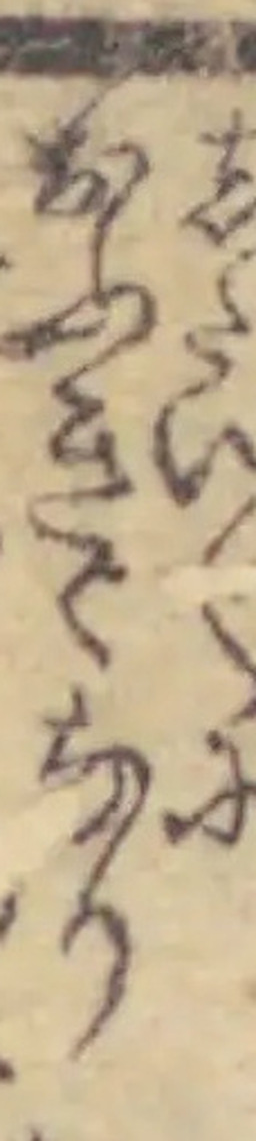おふきくなり
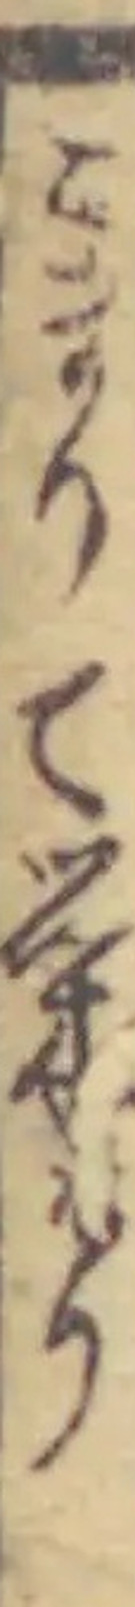こまりて栄けり
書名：家伝寿命薬 2巻
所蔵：国立国会図書館 National Diet Library, JAPAN
